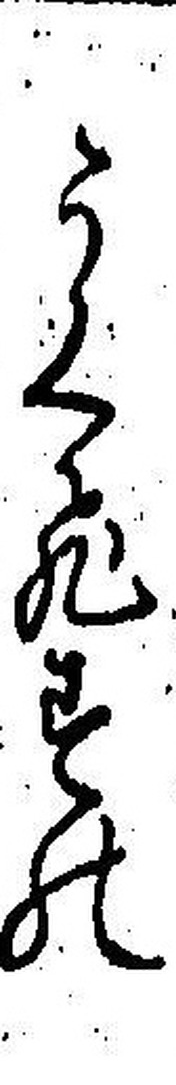うくひすの
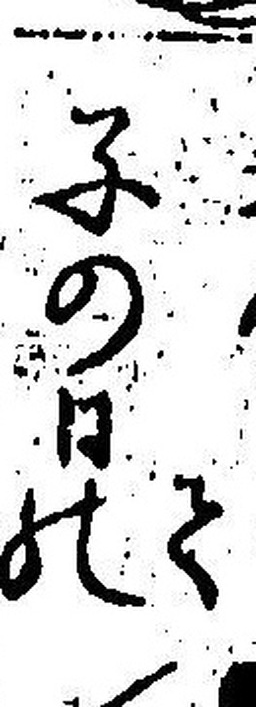子の日の
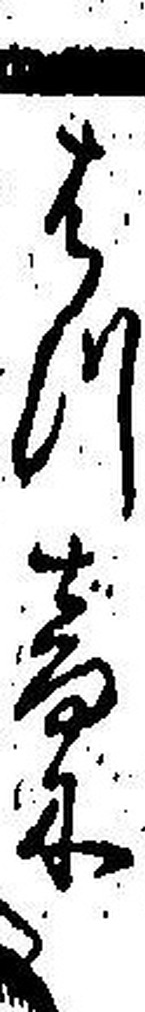はつ音に
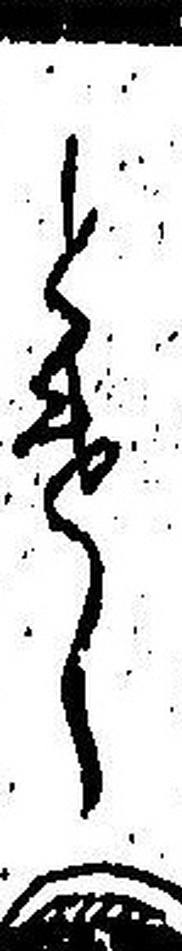とけし
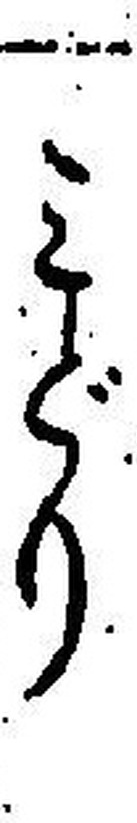みどり
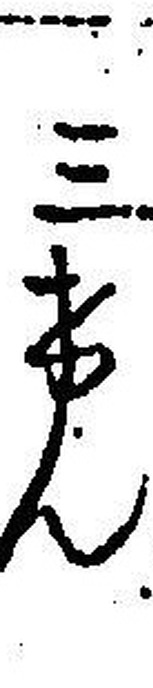三けん
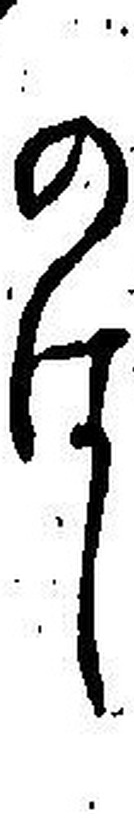のばし
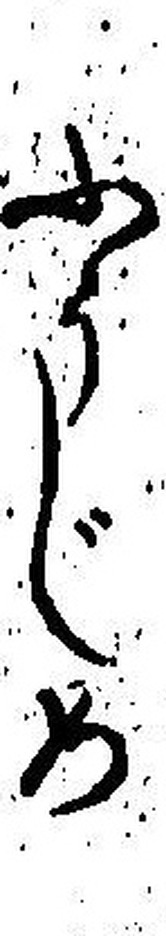ふうじめ
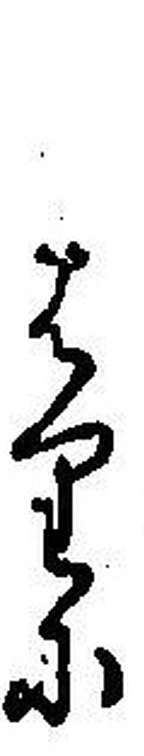はりに
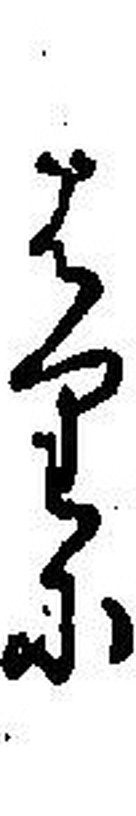はりに
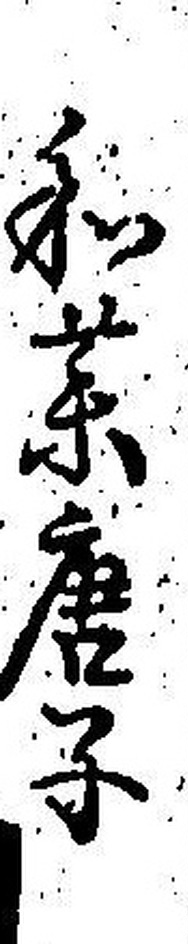和薬唐子
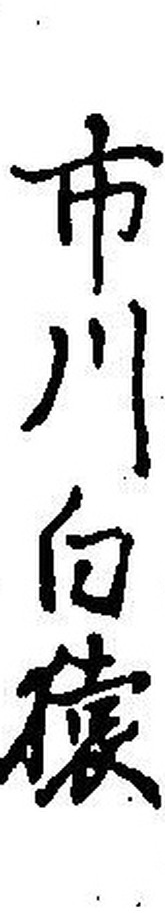市川白猿
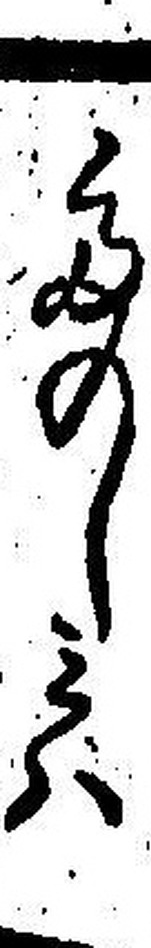たのしみは
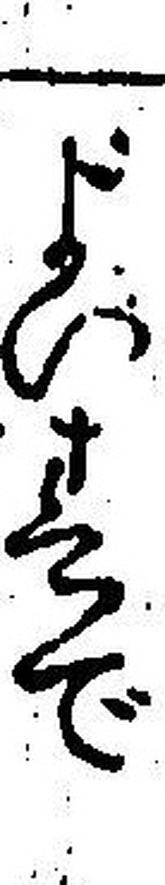よい春で
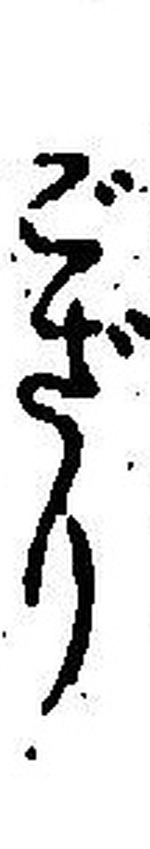ござり
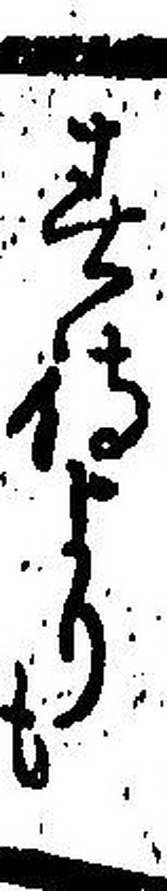春待よりも
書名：どうれ百人一首 / 鹿都部真顔(狂歌堂)編
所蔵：東京大学総合図書館 General Library in the University of Tokyo, JAPAN
